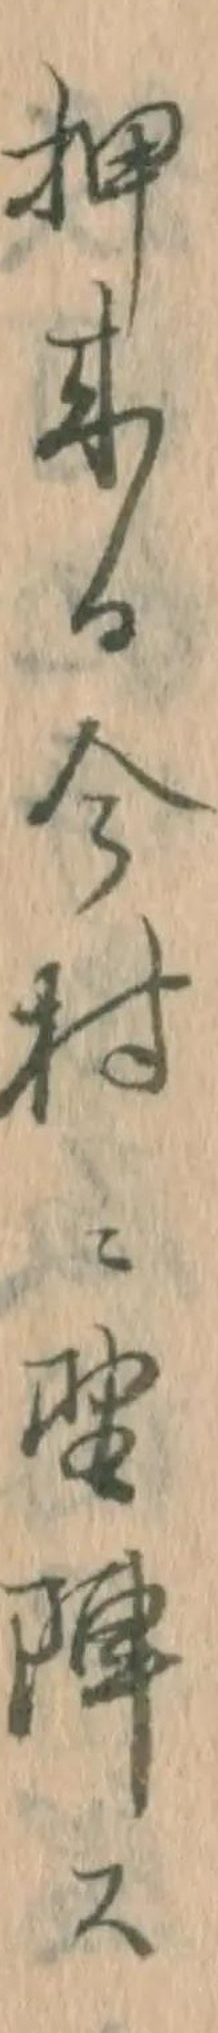押来る今村に野陣す
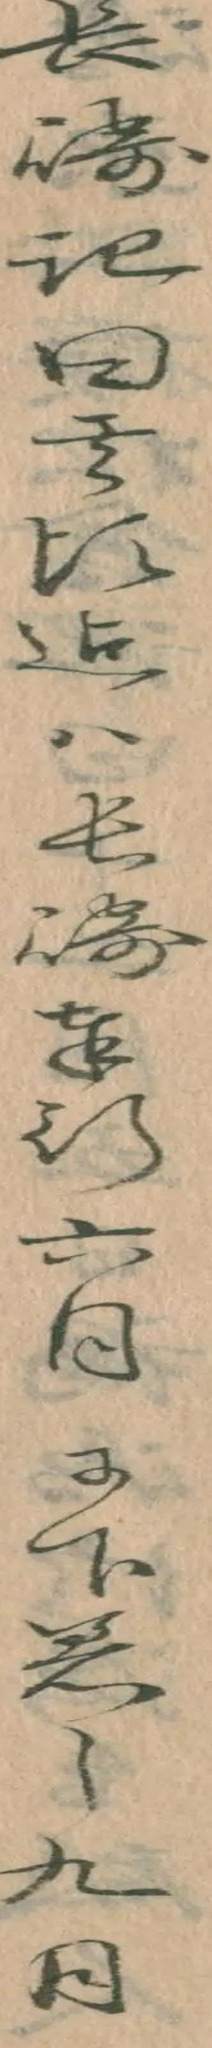長崎記曰其頃迄は長崎奉行六月に下着し九月
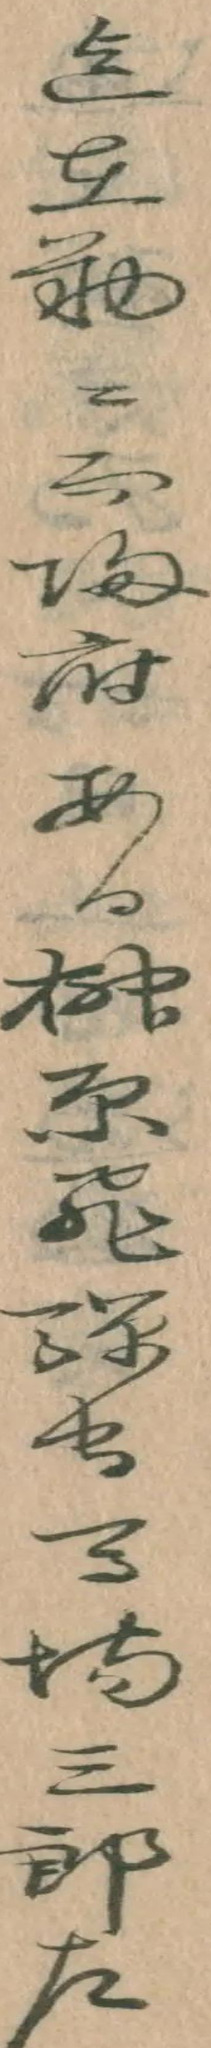迄在勤に而帰府ある榊原飛騨守馬場三郎左
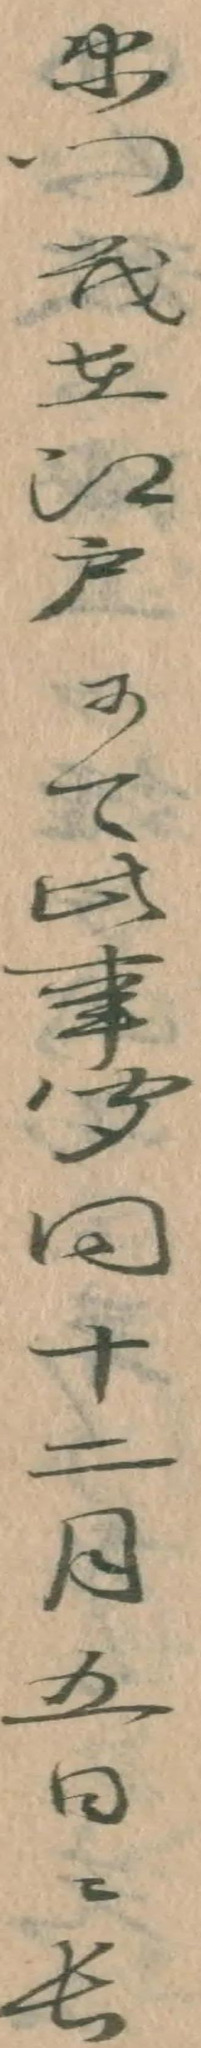衛門も在江戸にて此事聞同十二月五日に長
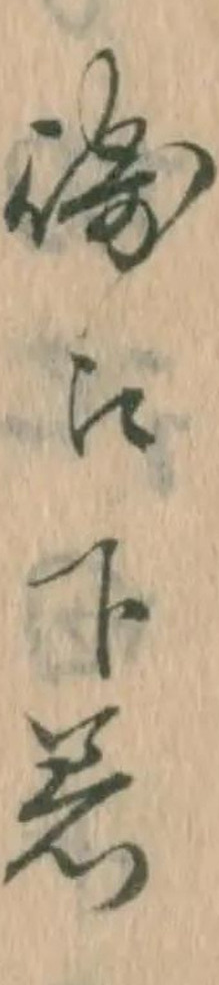崎江下着
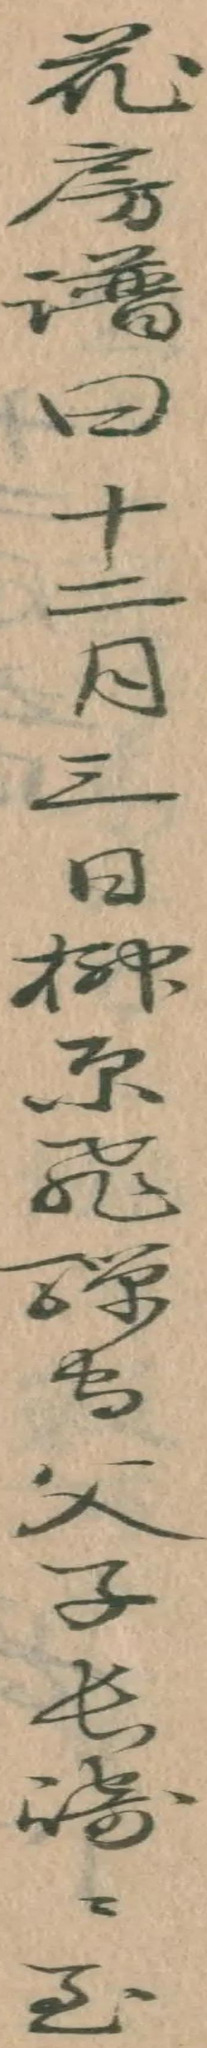花房譜曰十二月三日榊原飛騨守父子長崎に至
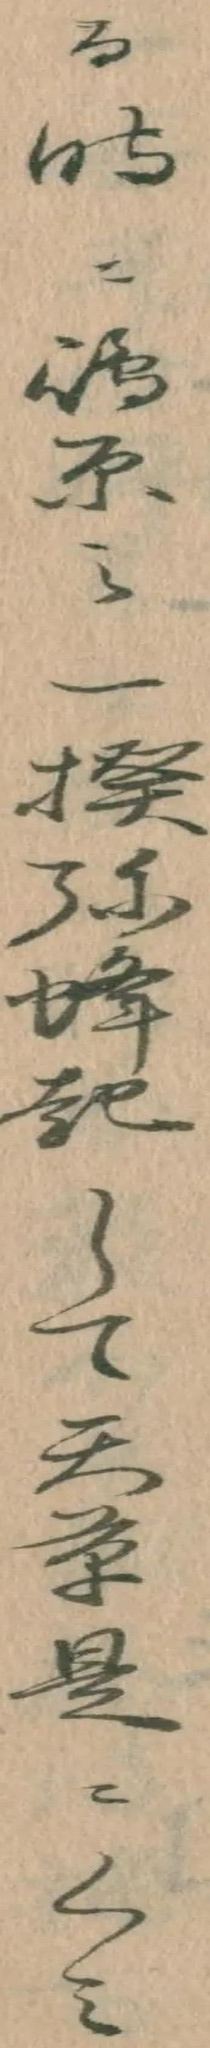る時に島原之一揆弥蜂起して天草是にくみ
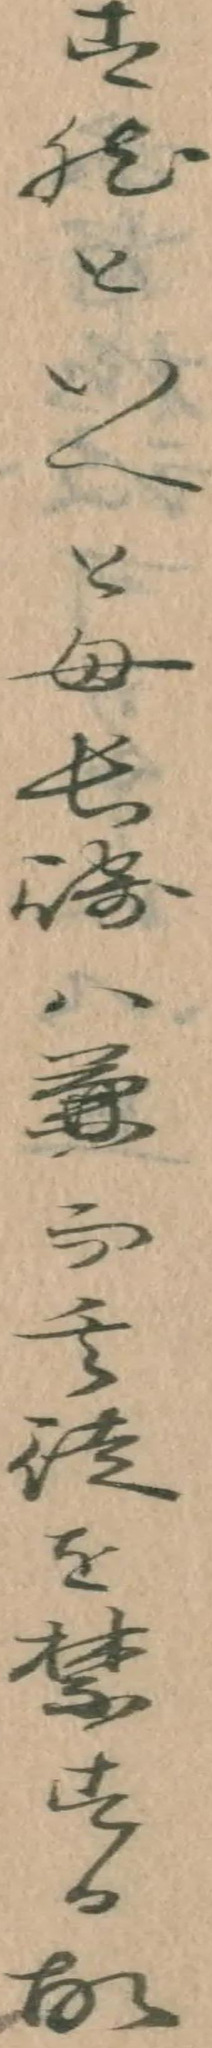す然といへとも長崎は兼而其徒を禁する故
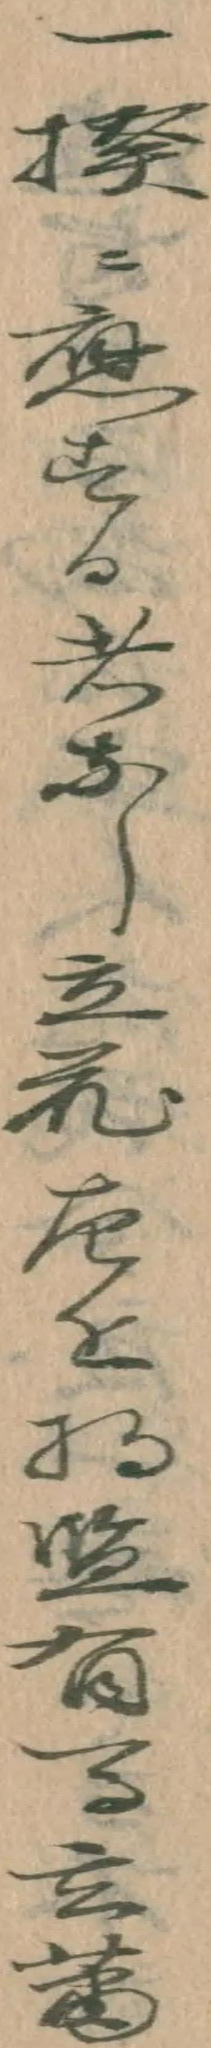一揆に応する者なし立花左近将監有馬玄蕃
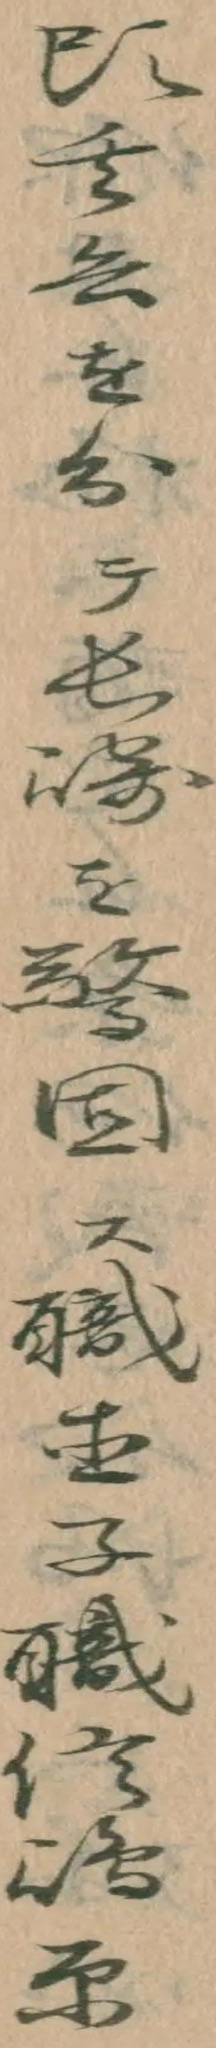頭其兵を分て長崎を驚固す職直子職信島原
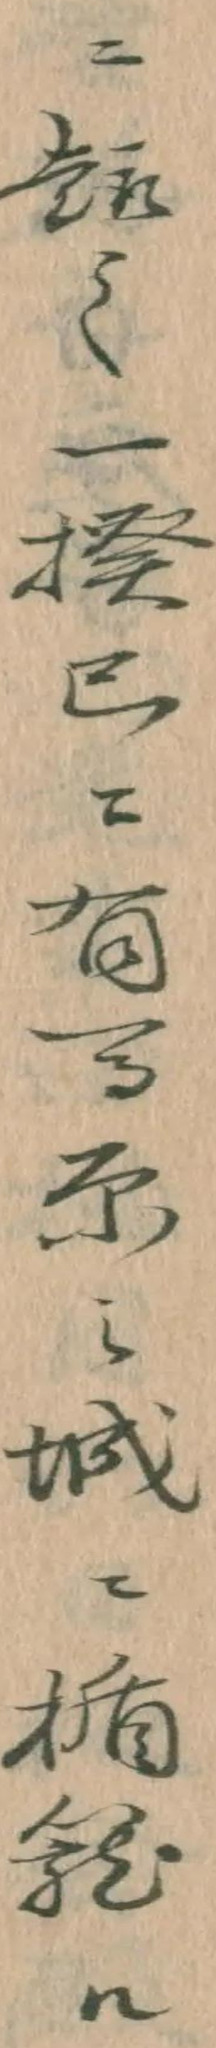に趣て一揆已に有馬原之城に楯籠候
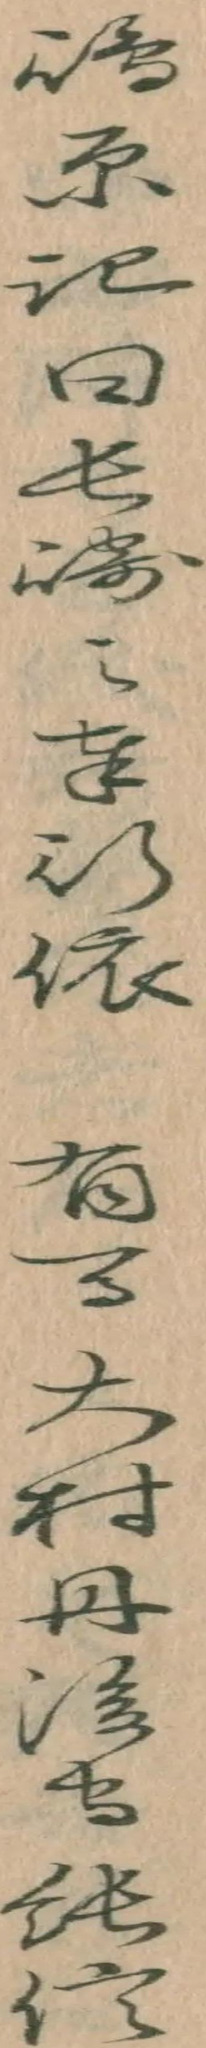島原記曰長崎之奉行依有馬大村丹後守純信
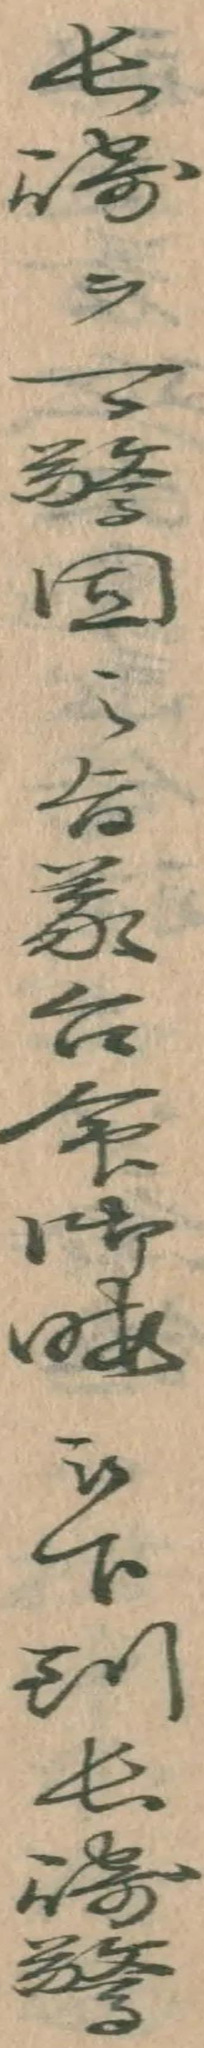長崎を可驚固之旨蒙台命御暇被下到長崎驚
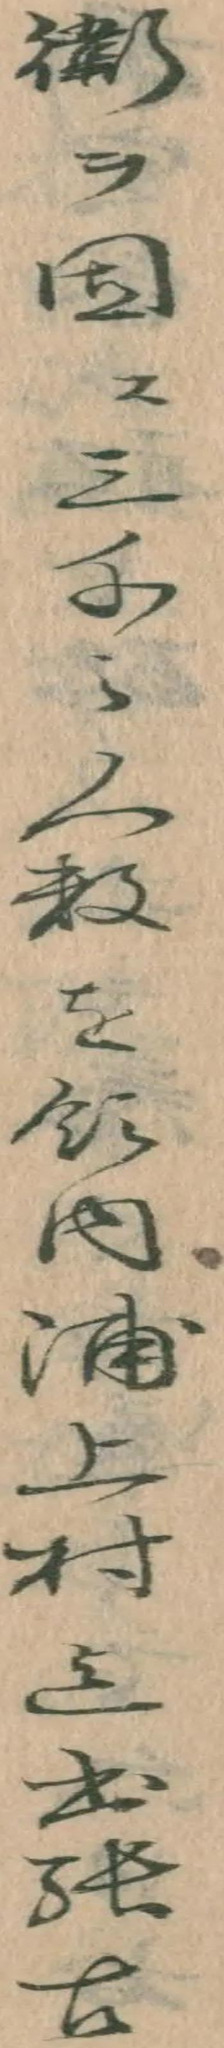衛を固す三千之人数を領内浦上村迄出張右
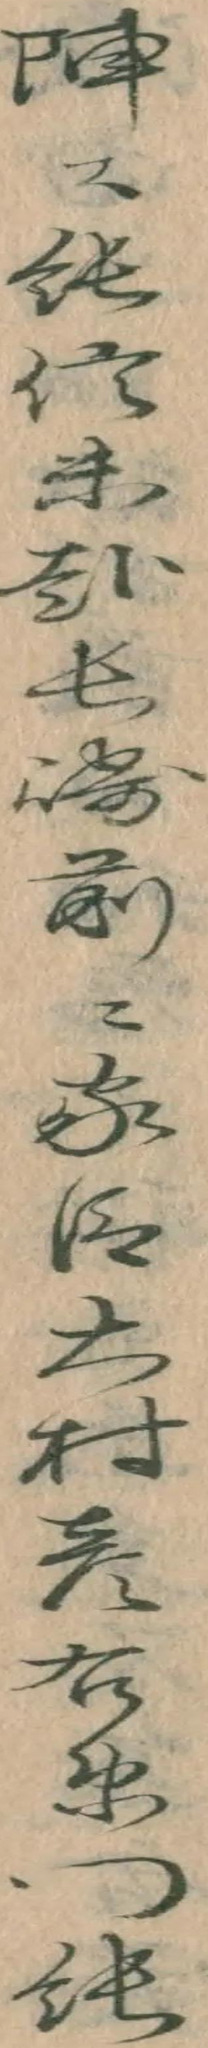陣す純信未赴長崎前に家臣大村彦右衛門純
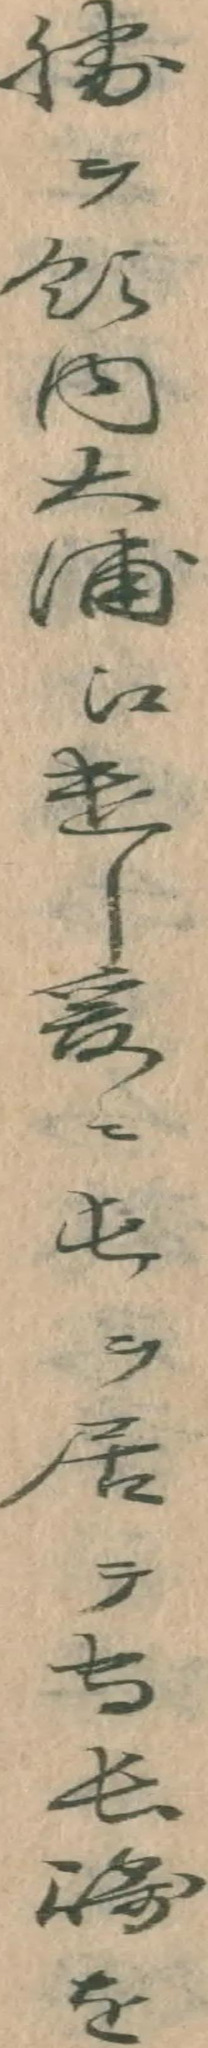勝を領内大浦江遣し爰に屯を居て守長崎を
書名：切支丹御退治記 49巻. [3]
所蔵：国立国会図書館 National Diet Library, JAPAN
